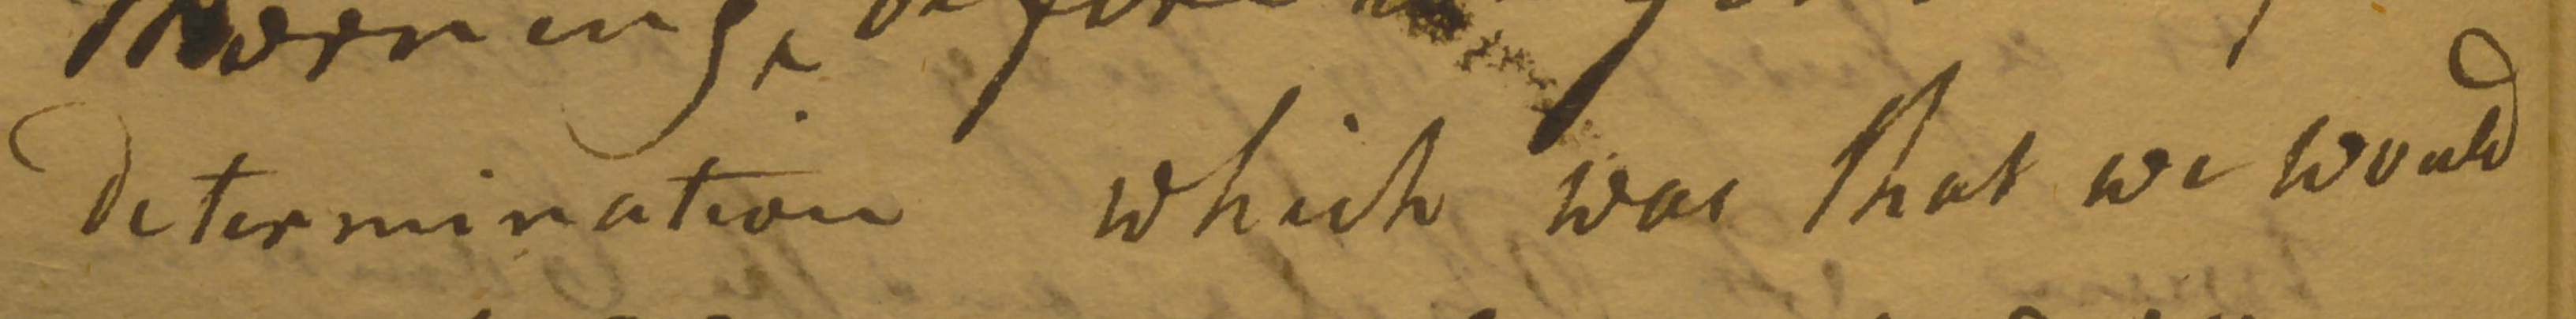determnation. which was that we would
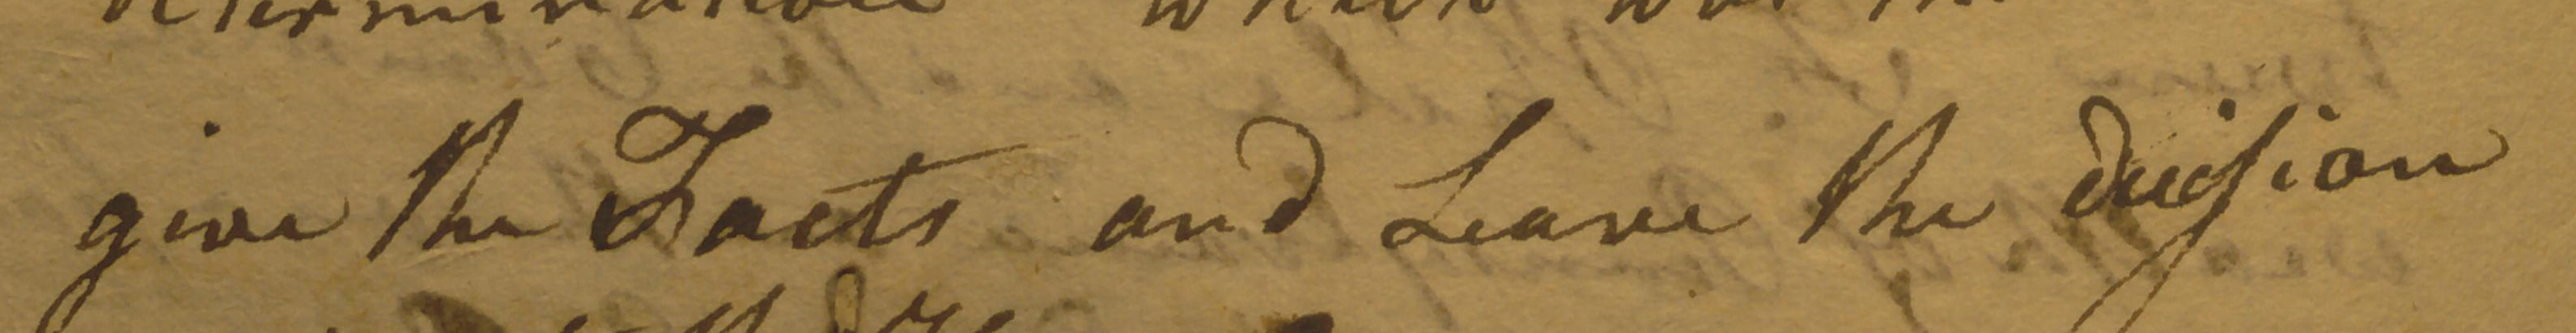give the Facts and Leave the decision
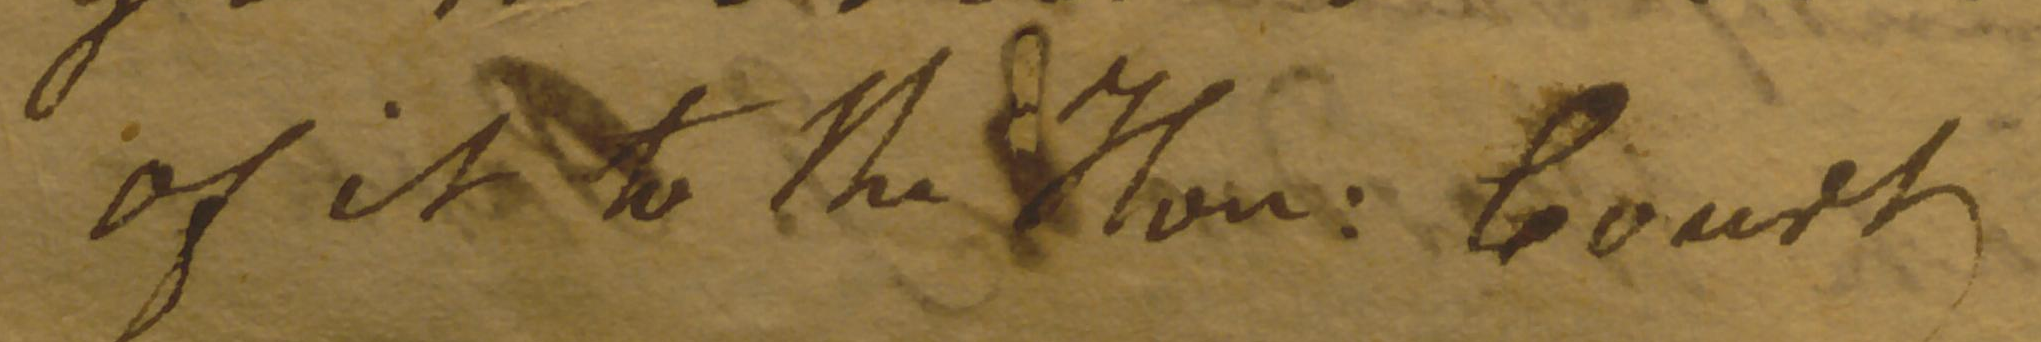of it to the Hon: Court
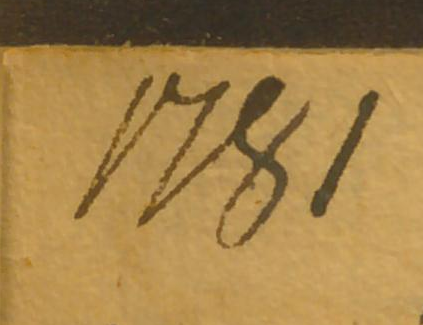1781
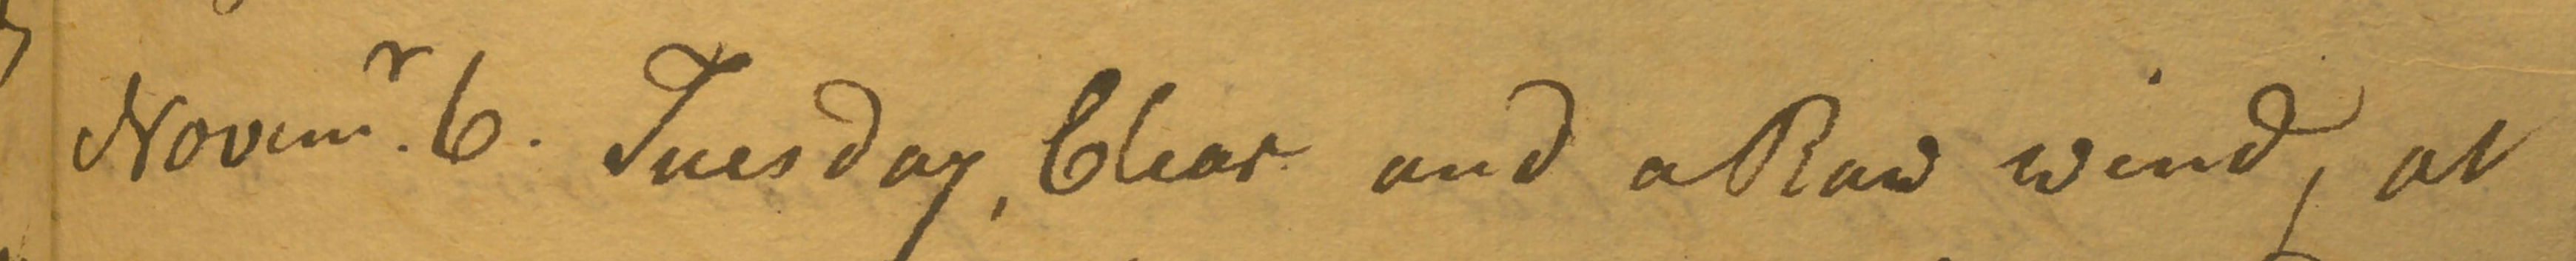Novem^r. 6. Tuesday, Clear and a Raw wind, at
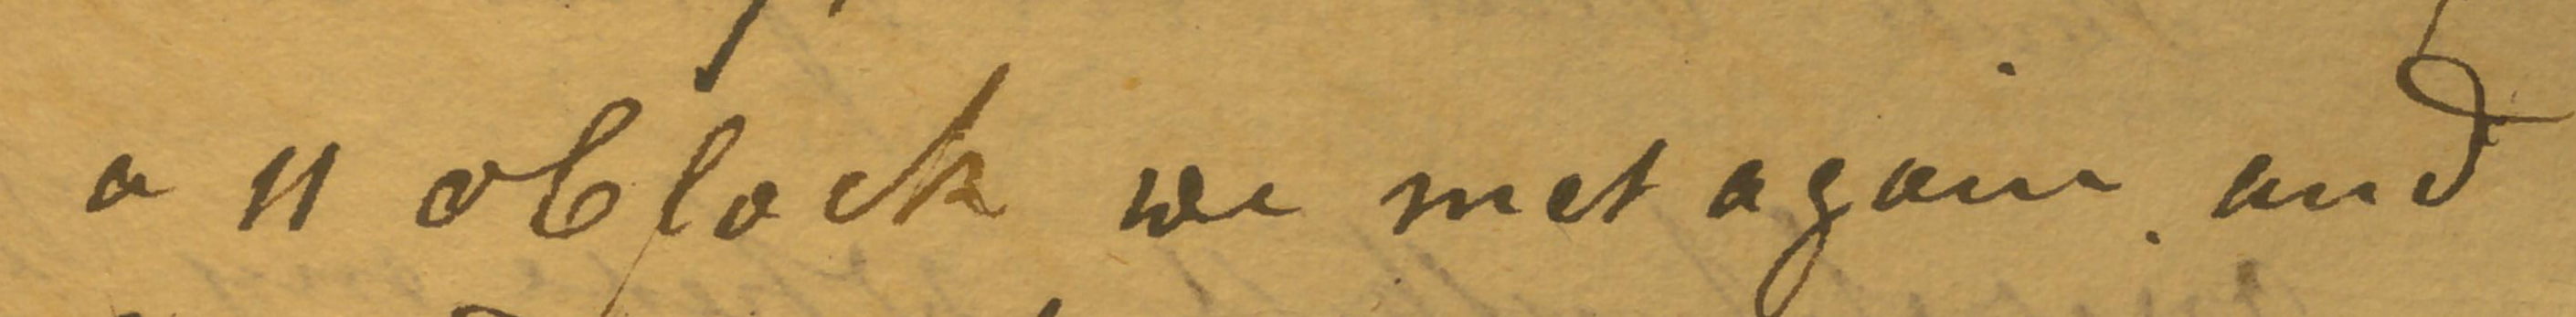a 11 oClock we met again and
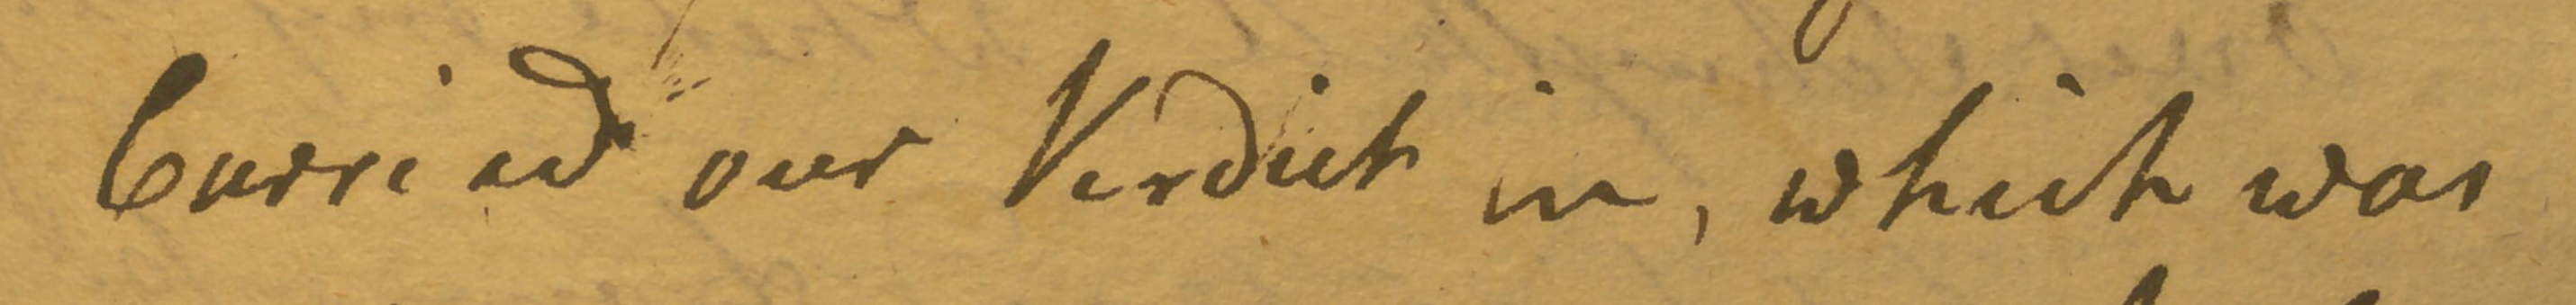Carried our Verdict in, which was
